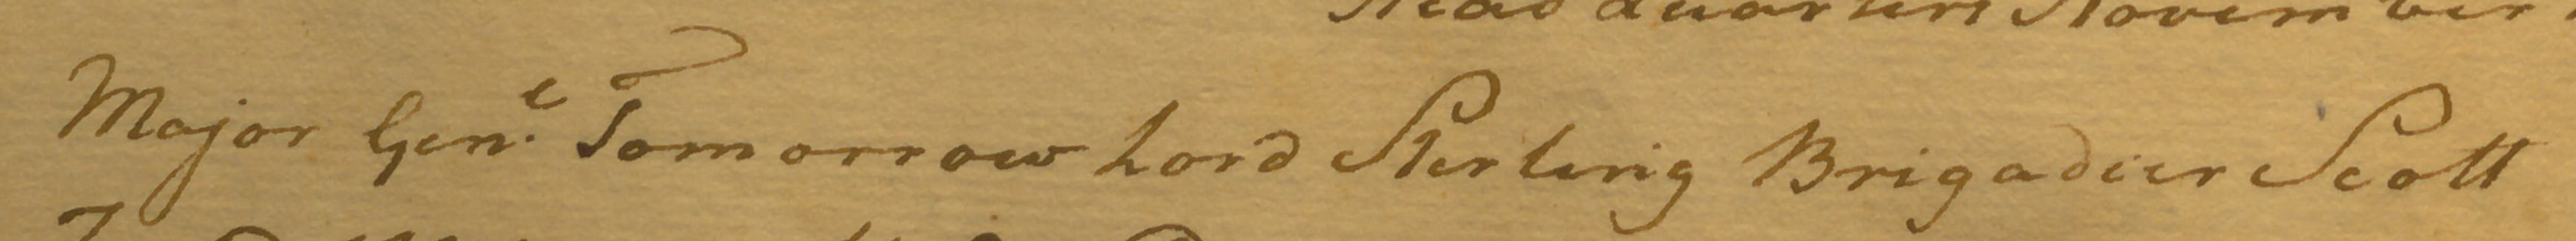Major Gen^l. Tomorrow Lord Sterling Brigadier Scott
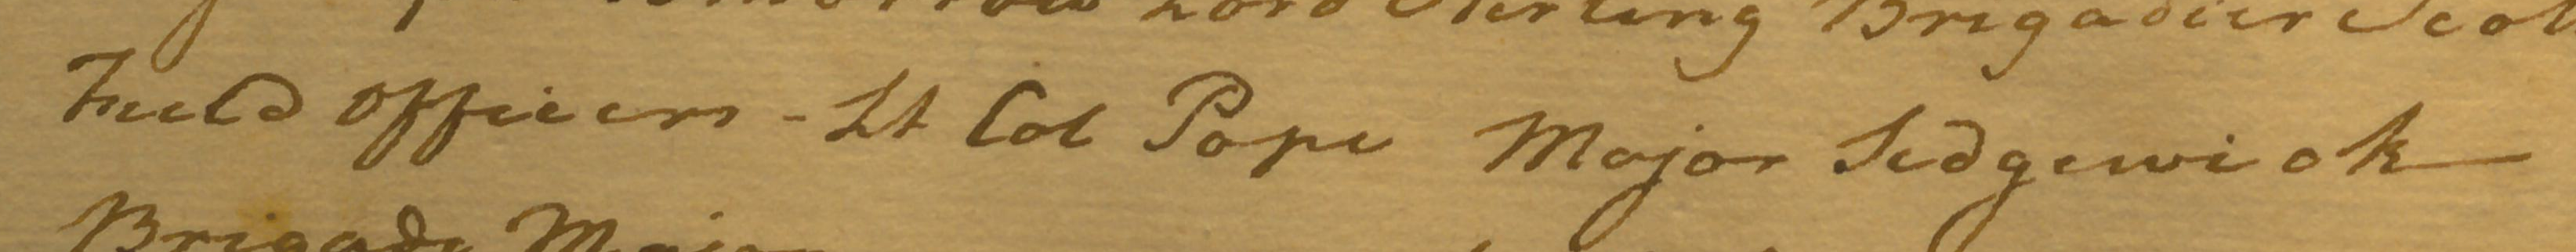Field Officers- Lt Col Pope Major Sedgewick-
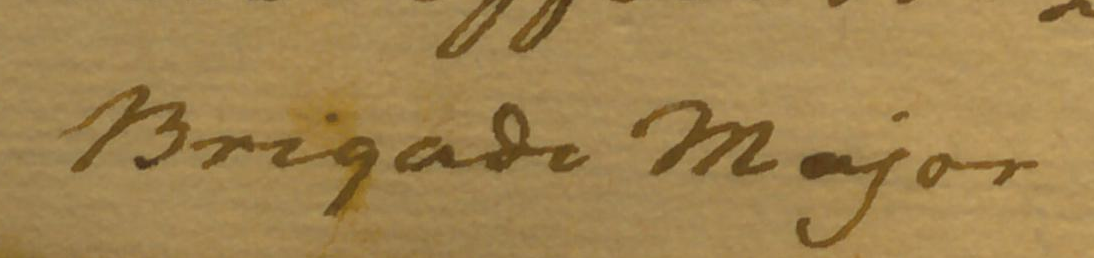Brigade Major
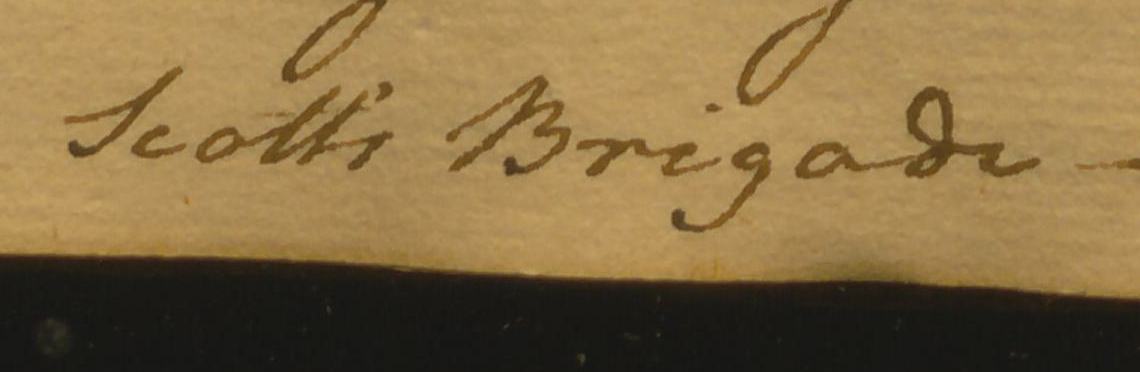Scott's Brigade
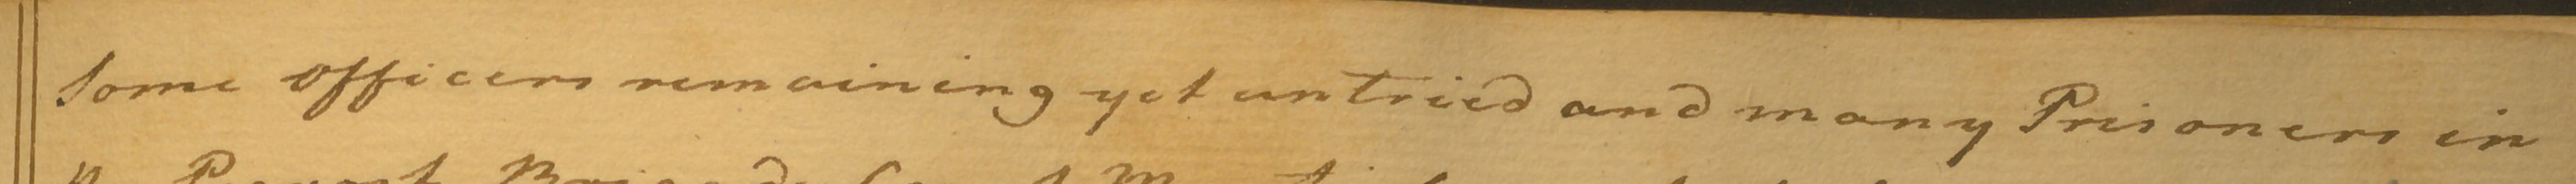Some officers remaining yet untried and many Prisoners in
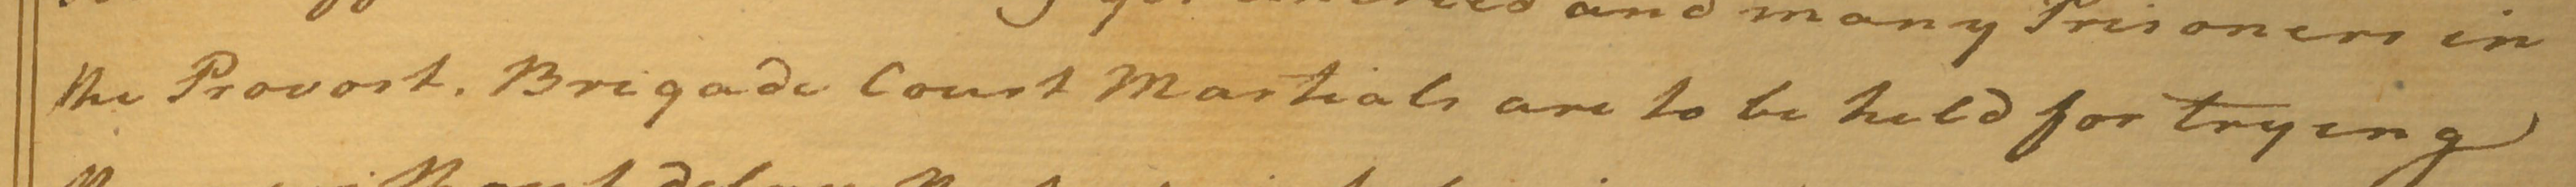the Provost. Brigade Court Martials are to be held for trying
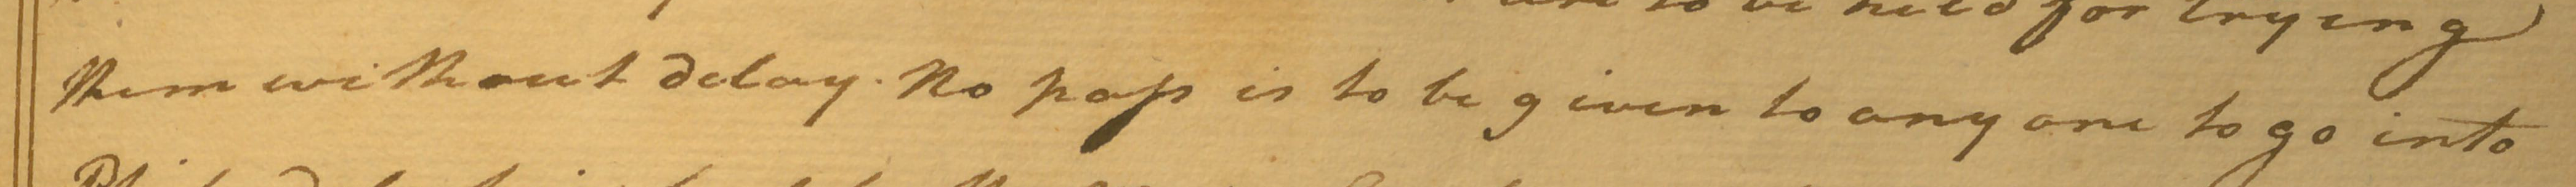them withot delay. No pass is to be given to any one to go into
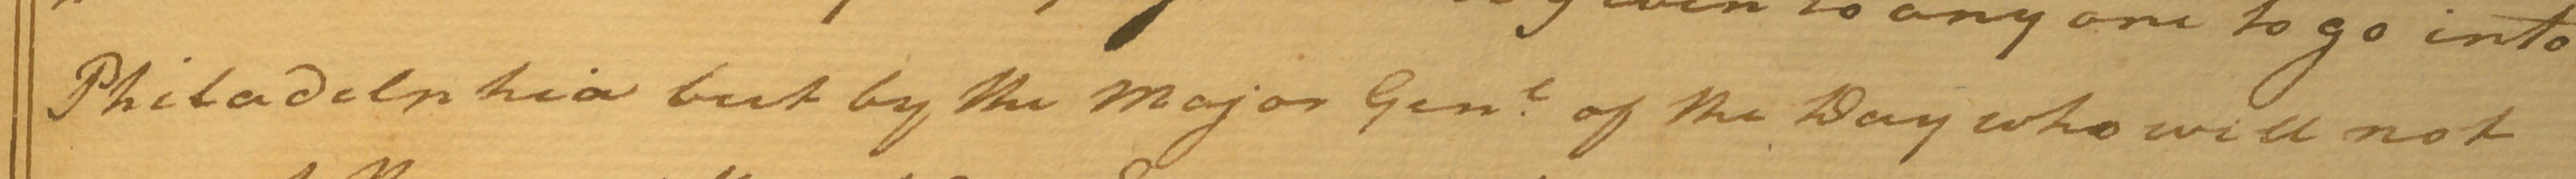Philadelphia but by the Major Gen^l. of the Day who will not
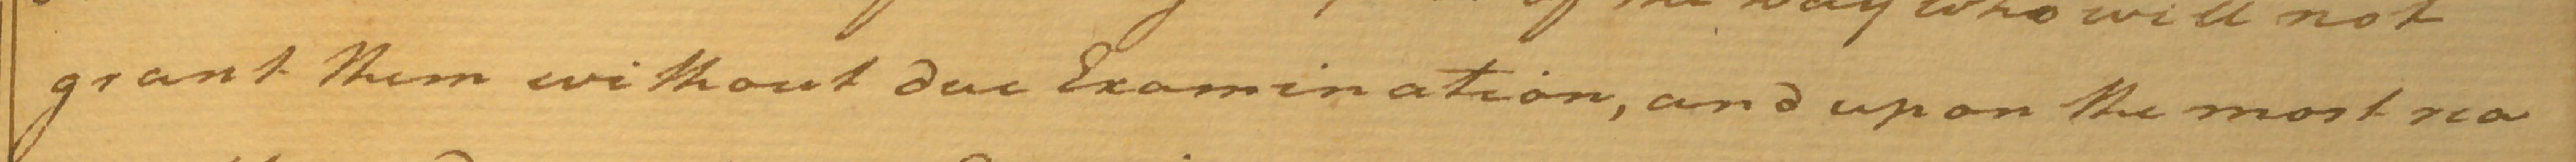grant them without due Examination, and upon the most rea
